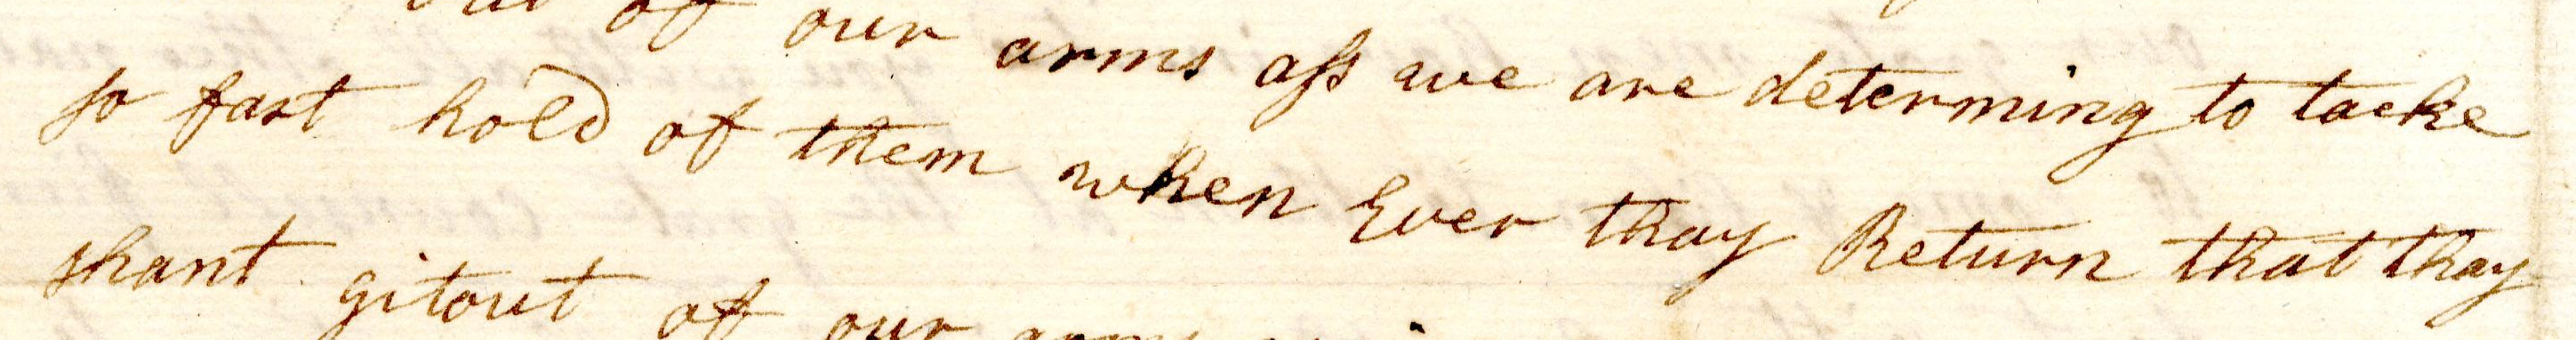so fast hold of them when Ever thay Return that thay
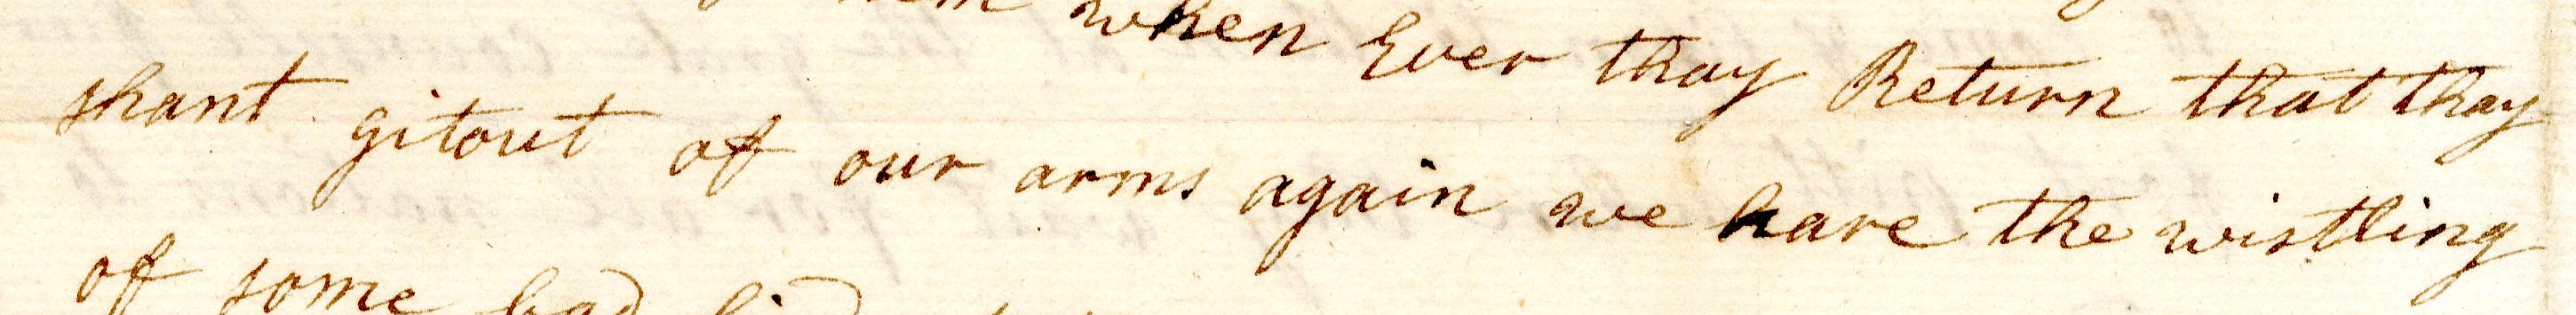shant gitout of our arms again we hare the wistling
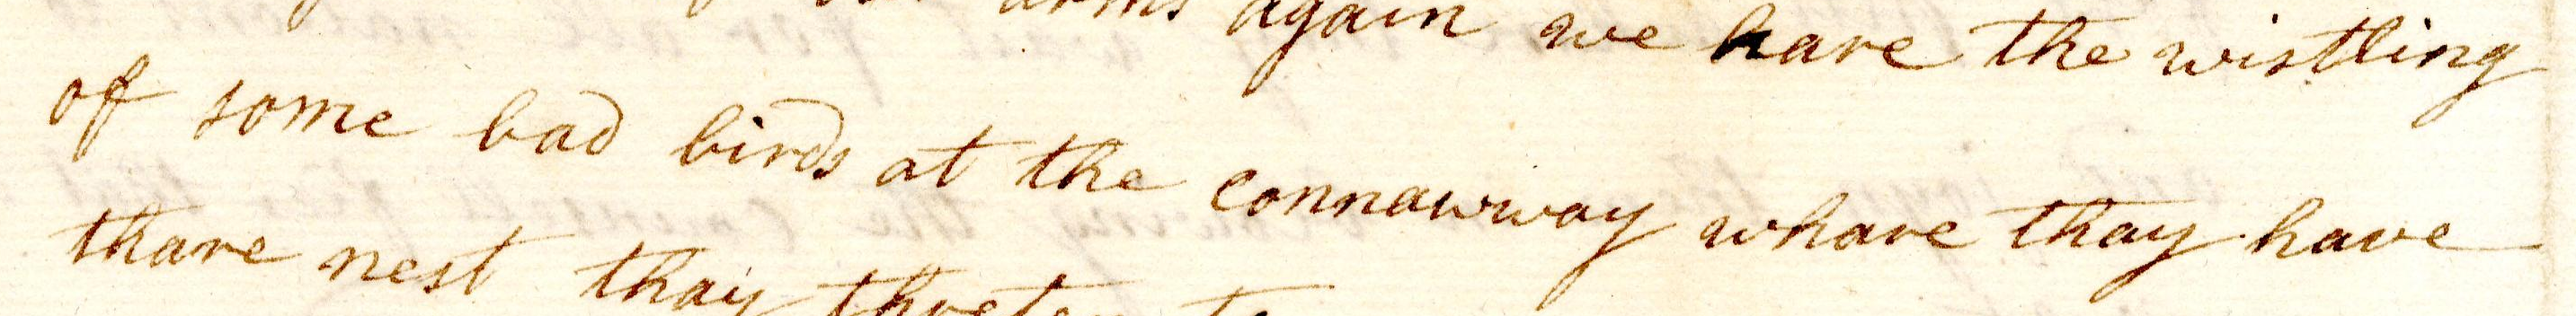of some bad birds at the connawway whare thay have
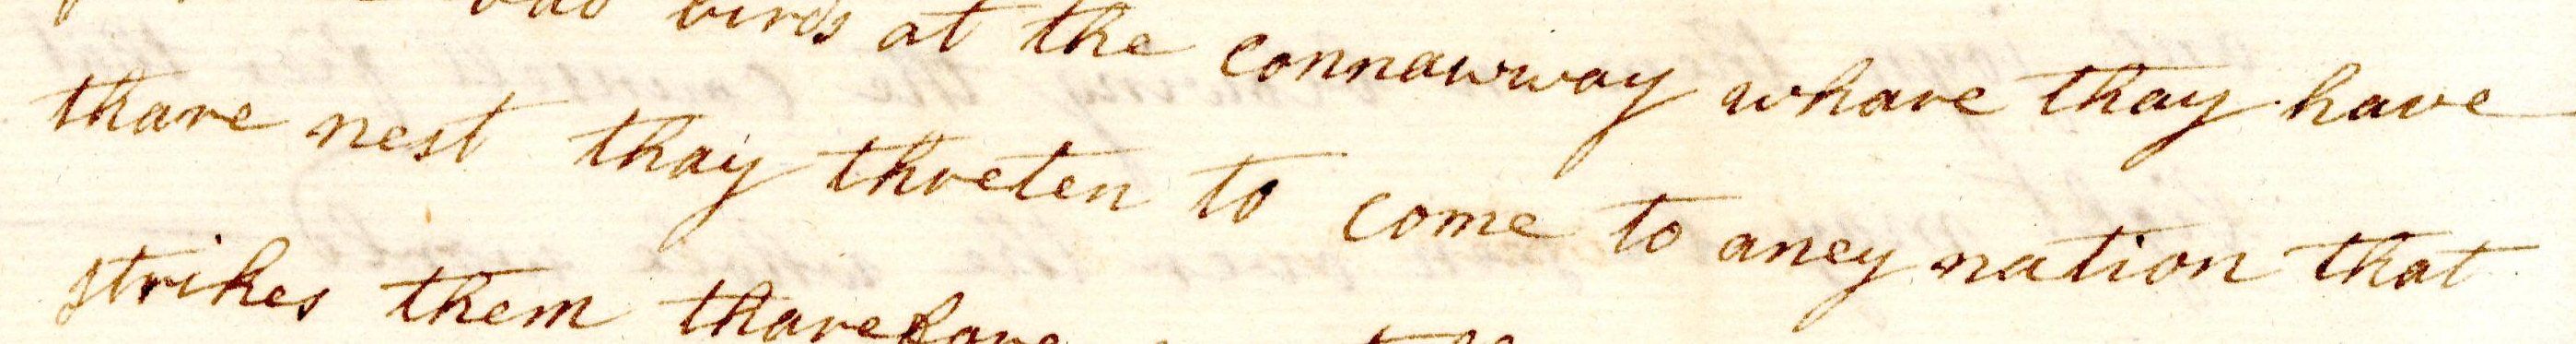thare nest thay threten to come to aney nation that
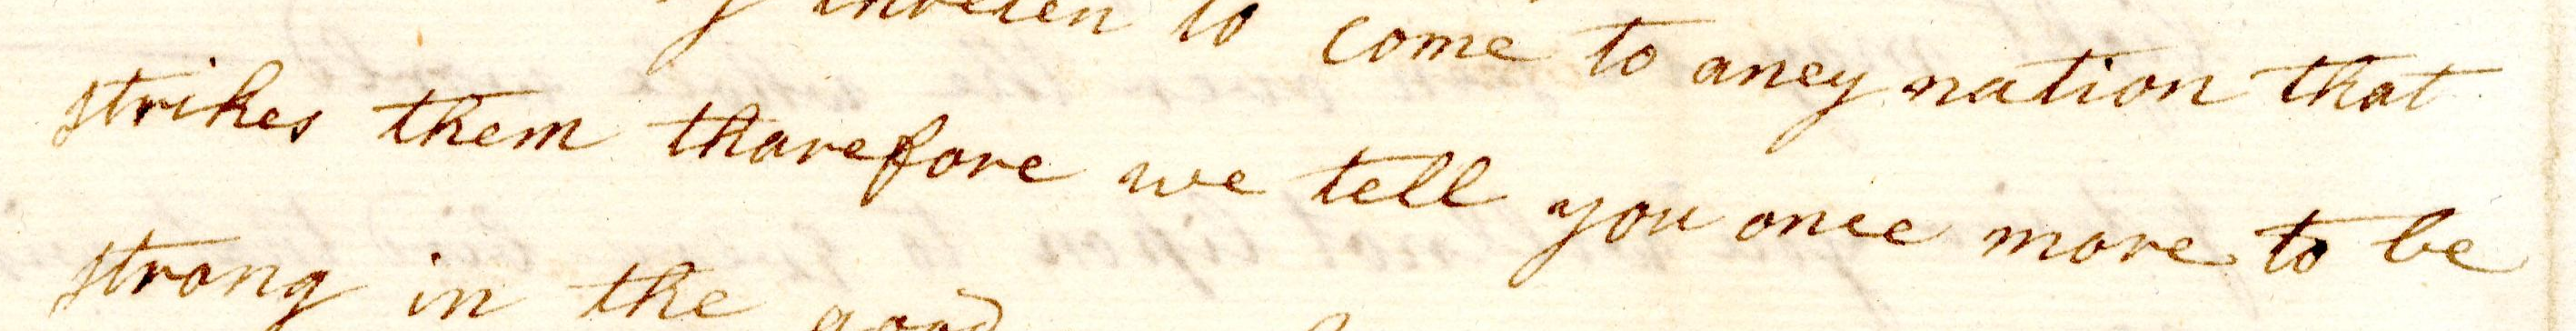strikes them tharefore we tell you once more to be
